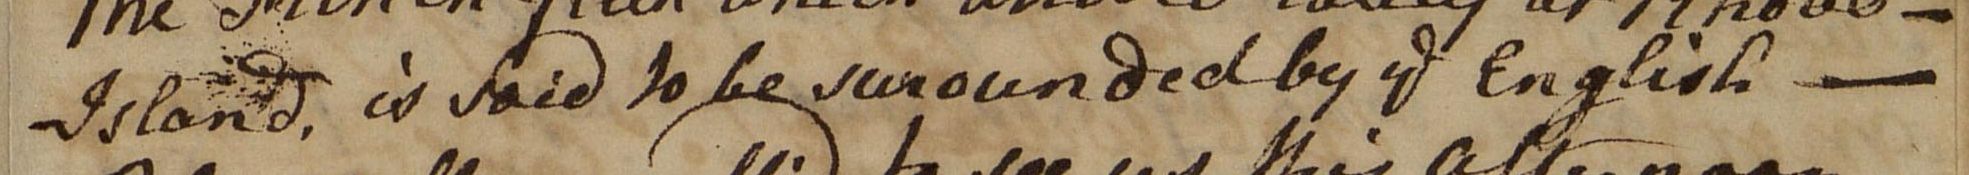-Island, is said to be surounded by y^e English-
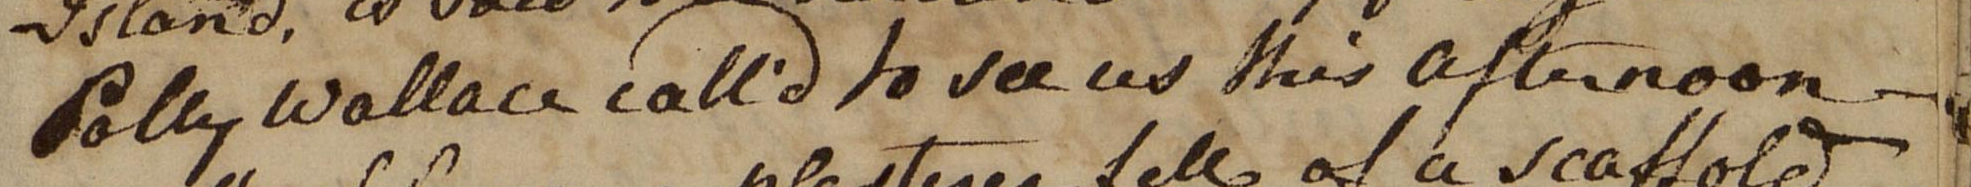Polly Wallace call'd to see us this Afternoon-
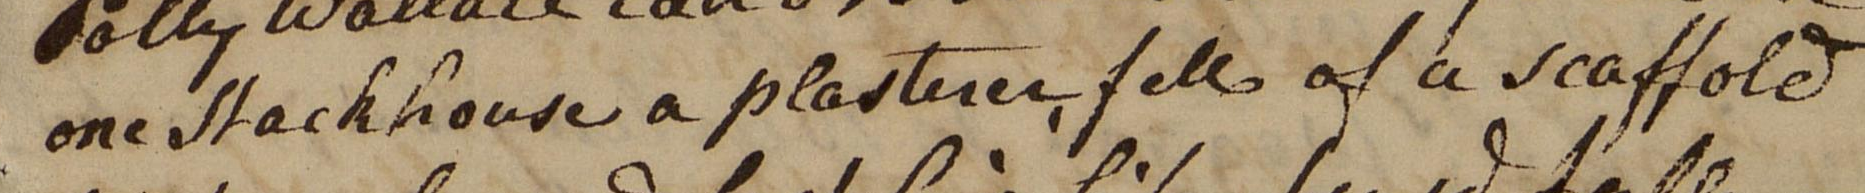one Stackhouse a plasterer fell of a scaffold
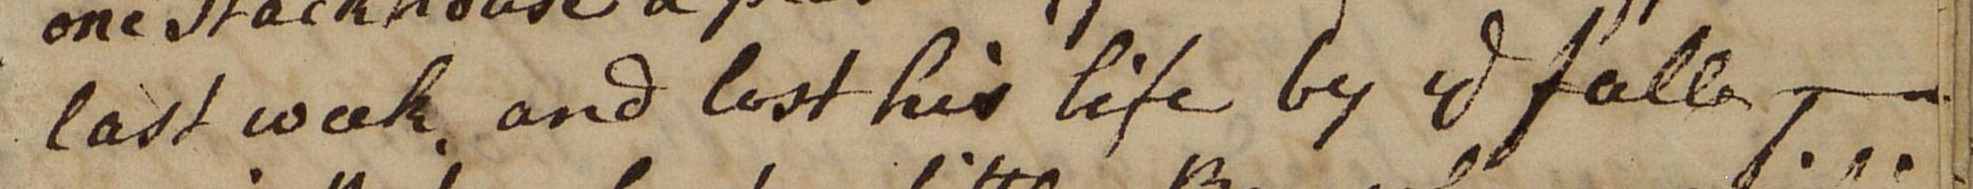last week, and lost his life by y^e fall-
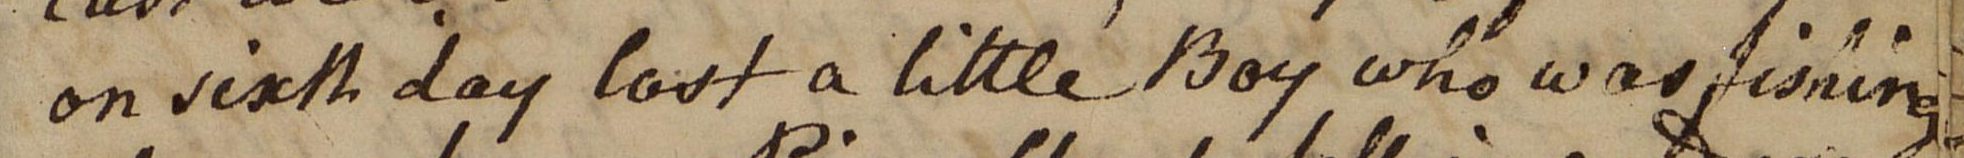on sixth day last a little Boy who was fishing
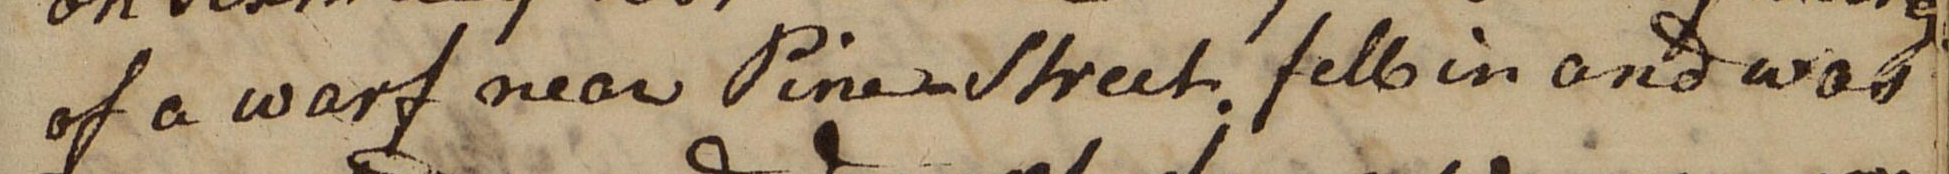of a warf near Pine Street fell in and was
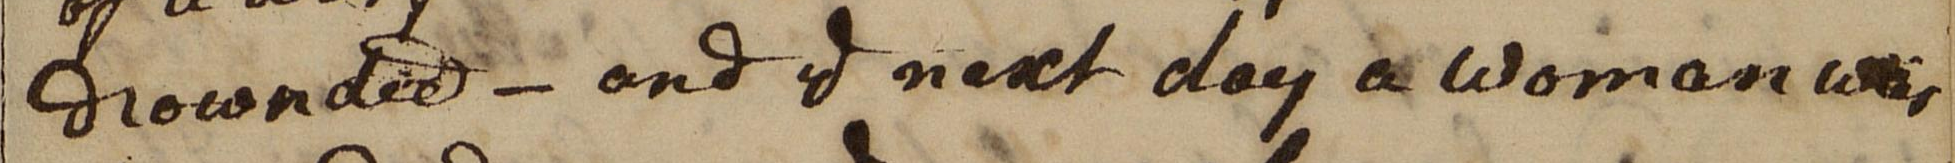drownded- and y^e next day a Woman was
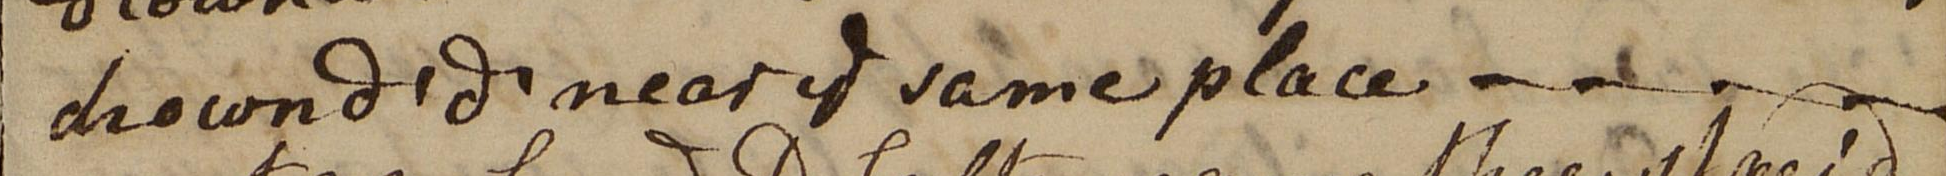drownd'd near y^e same place-
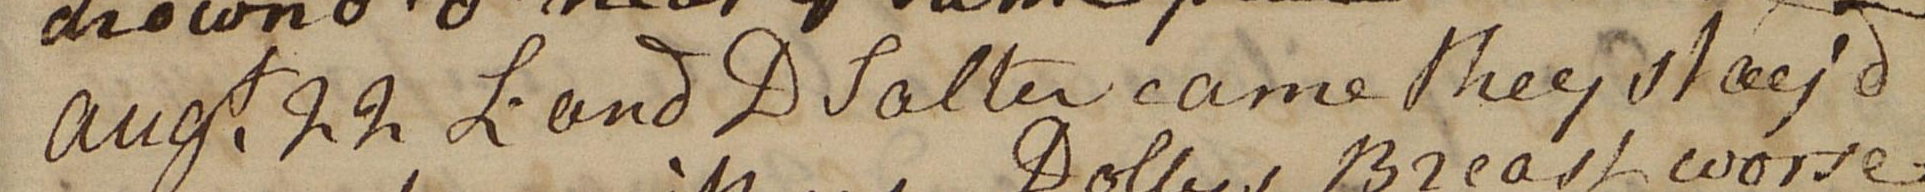Aug^t 22 Land D Salter came thee, stay'd
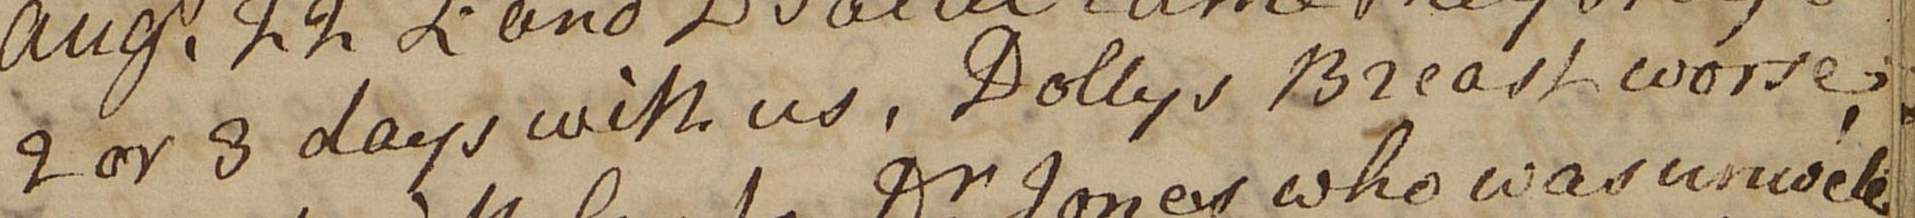2 or 3 days with us, Dollys Breast worse-
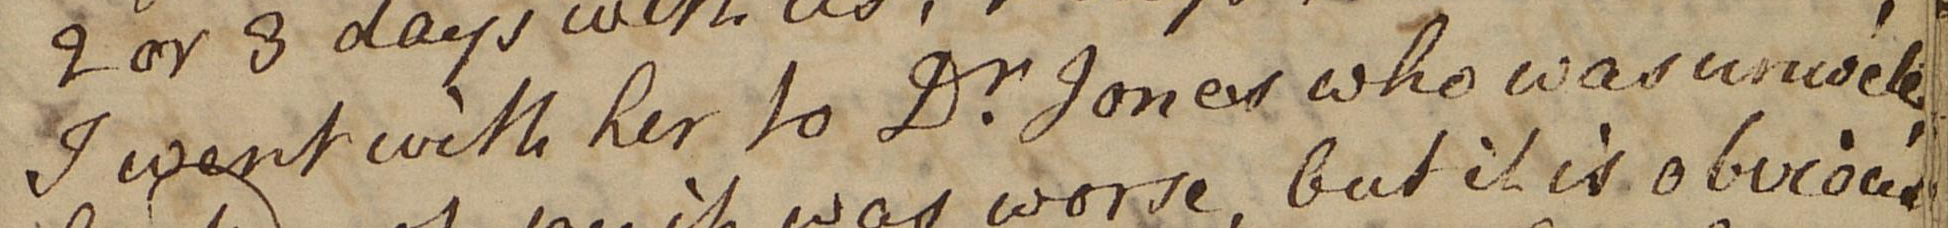I went with her to D^r. Jones who was unwell
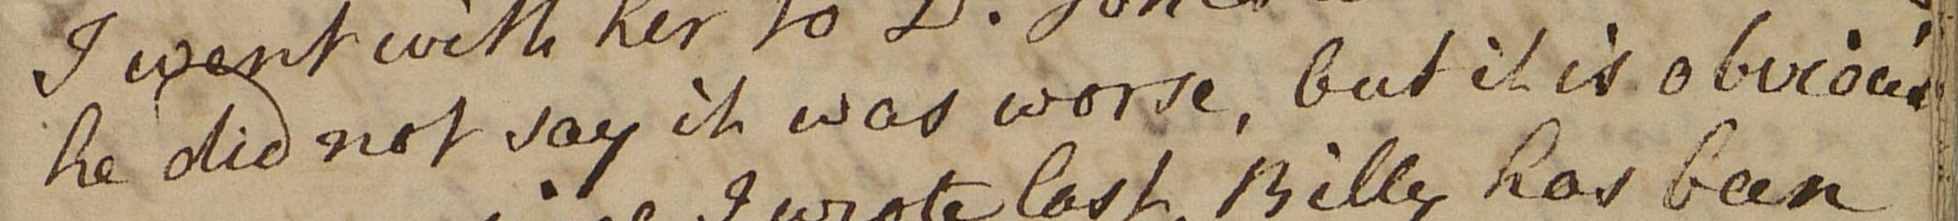be did not say it was worse, but it is obvious
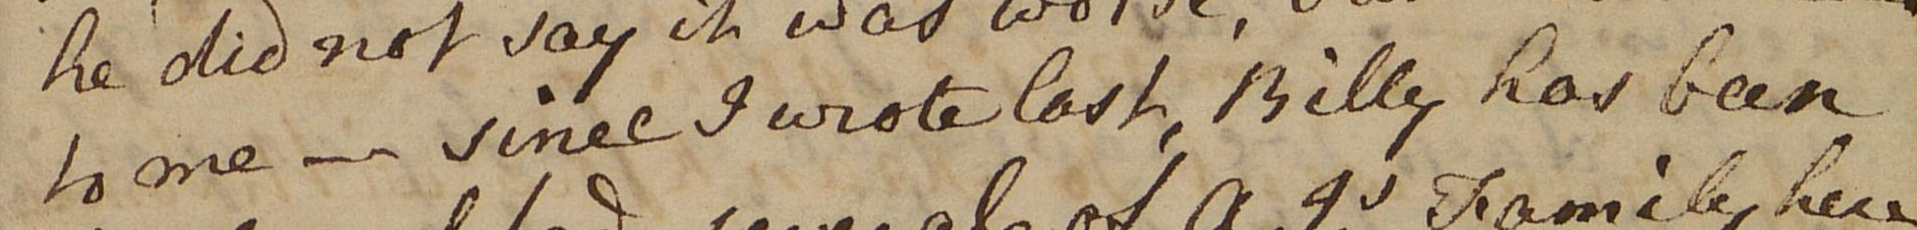is me- since I wrote last, Billy has been
